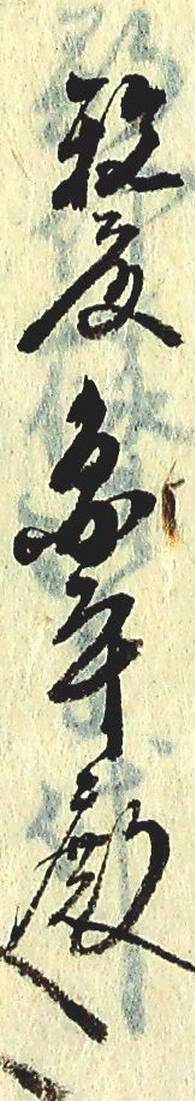数藤円平殿
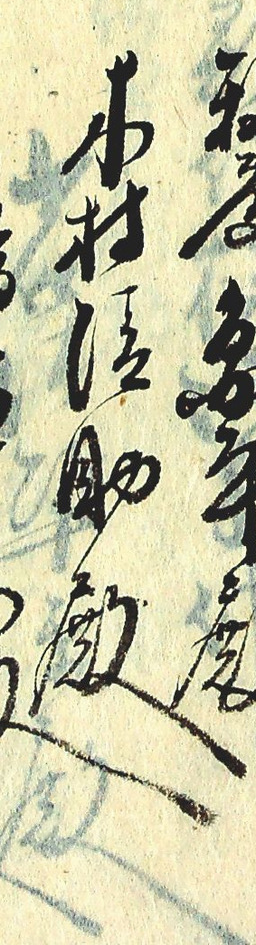木村清助殿
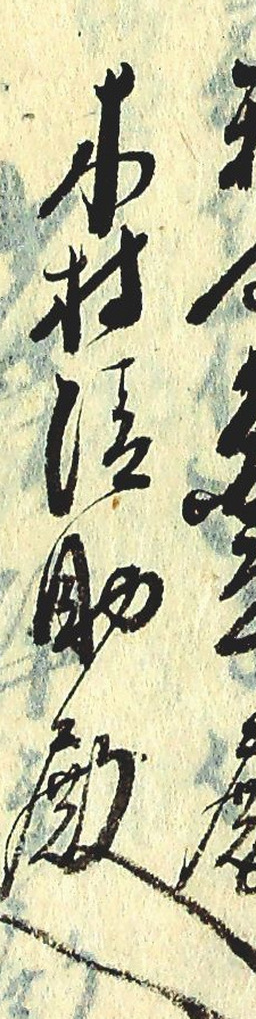木村清助殿
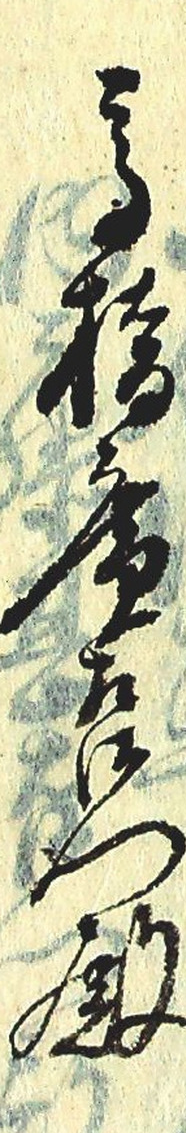高橋広左衛門殿
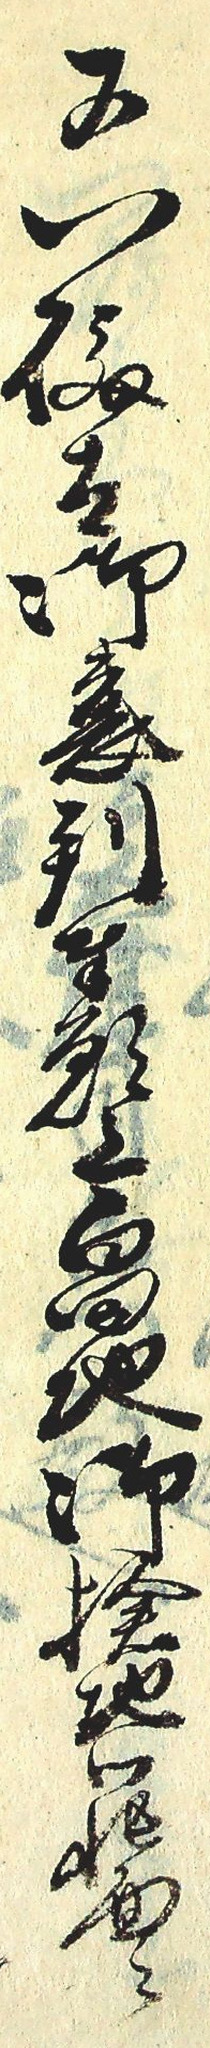右磯太御裏判奉願上畠地御検地御帳面に
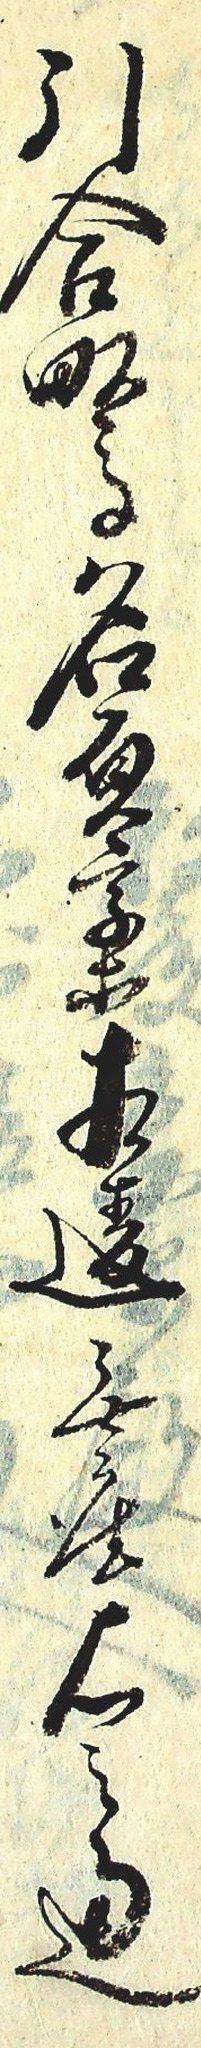引合畝高名負字等相違無御座右之通
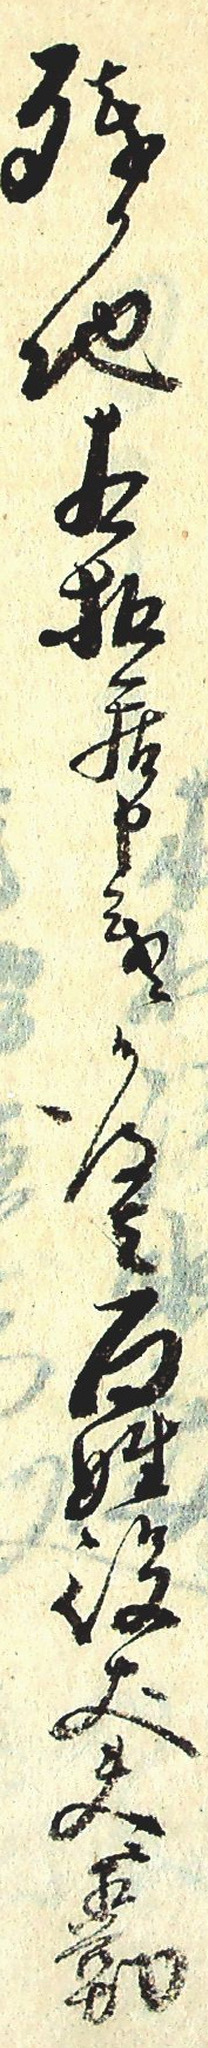残り地相扣居申義に候得は百姓役丈夫に相勤
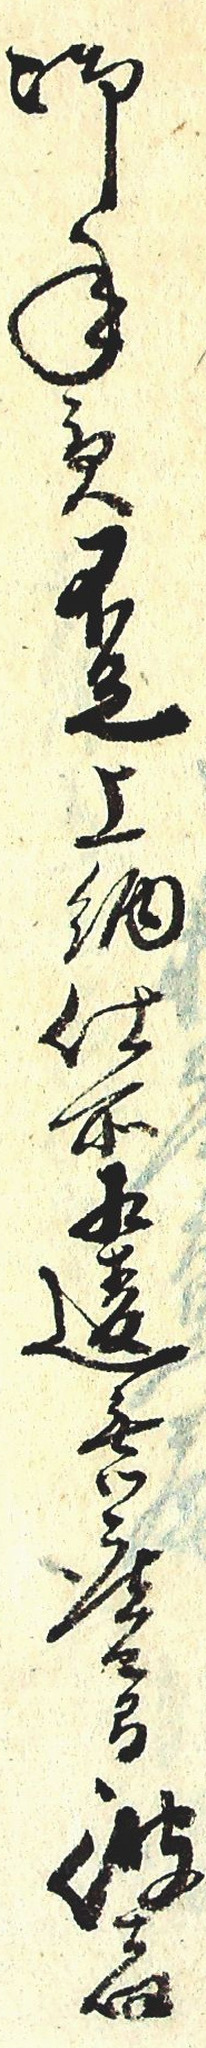御年貢不足上納仕所相違無御座候間彼者

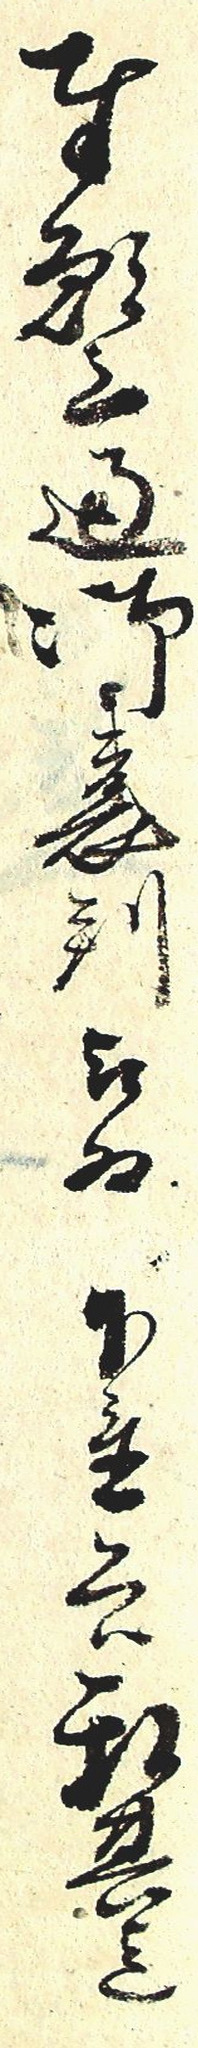奉願上通御裏判被為下置候へは私共迄
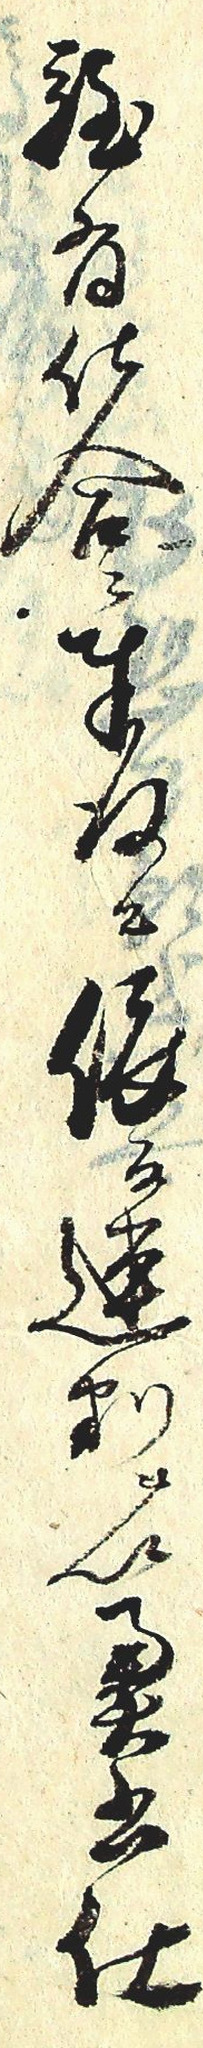難有仕合に奉存候依て連判を以奥書仕
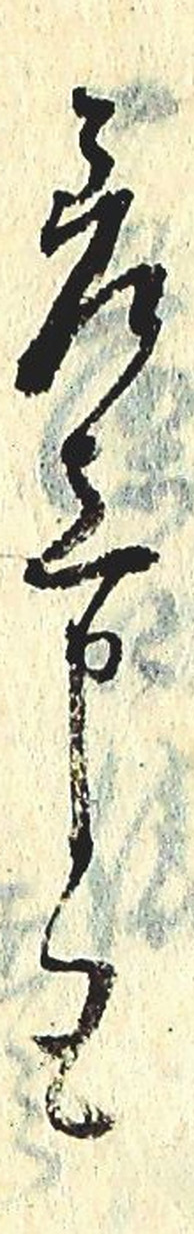差上申候以上
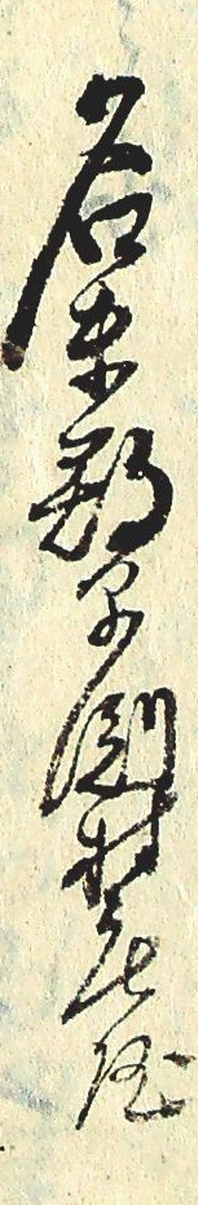名東郡早淵村庄屋
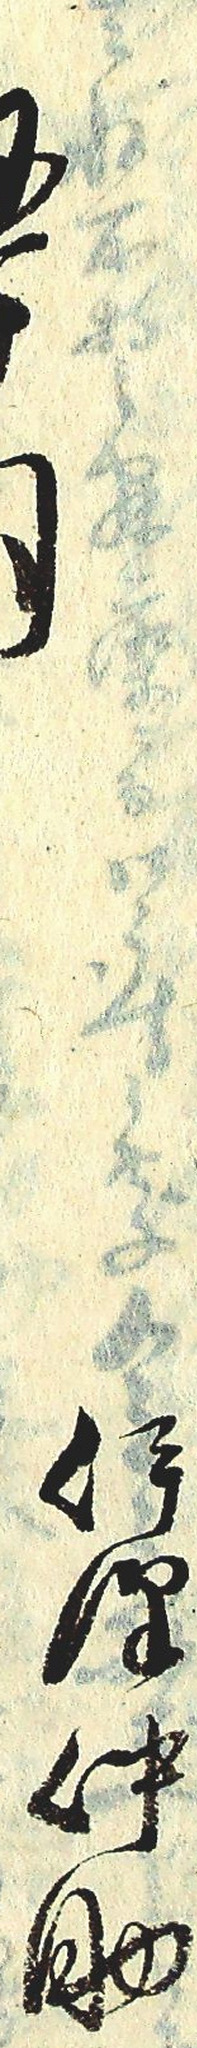丑十月伊沢仲助
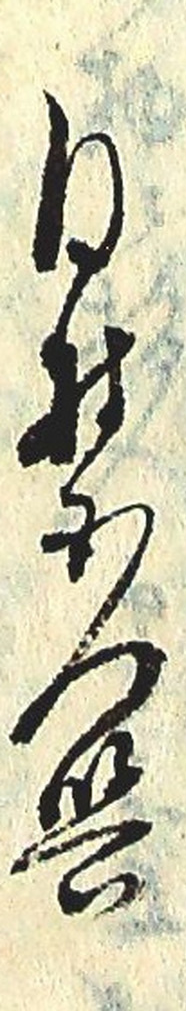同村五人与
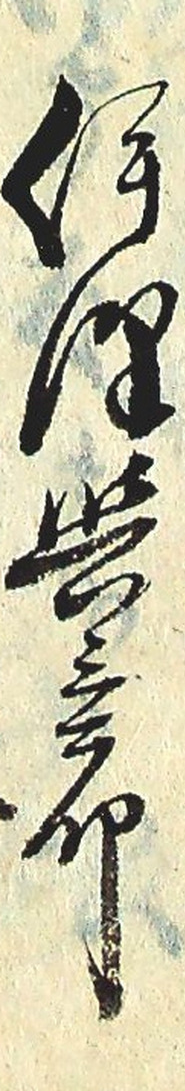伊沢与三郎
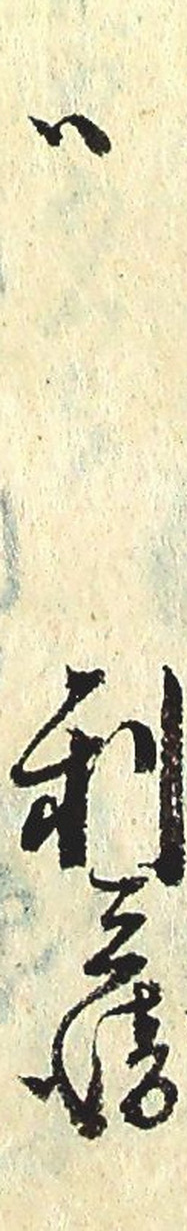同利兵衛
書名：諸御願書控(弐番）
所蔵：鳴門教育大学 Naruto University of Education
